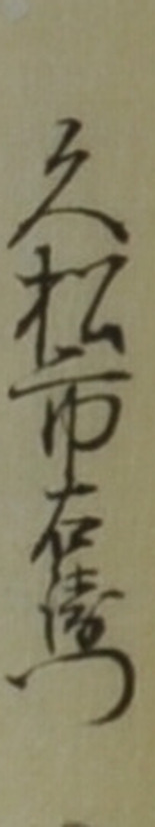久松市右衛門
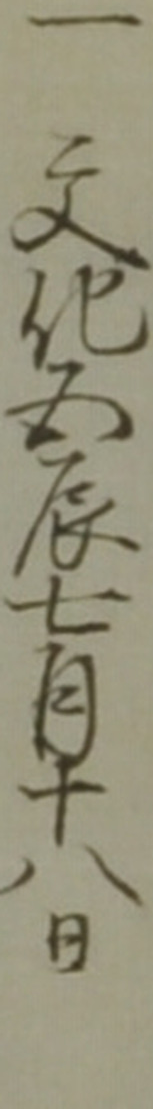一文化五辰七月十八日
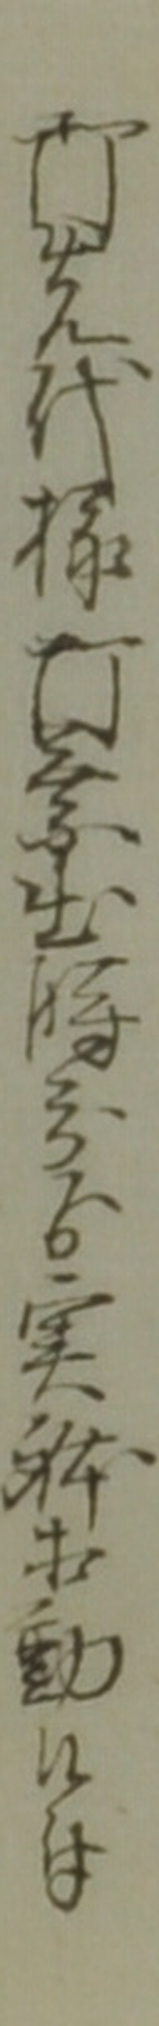御先代様御乗出時分ゟ実体相勤候付
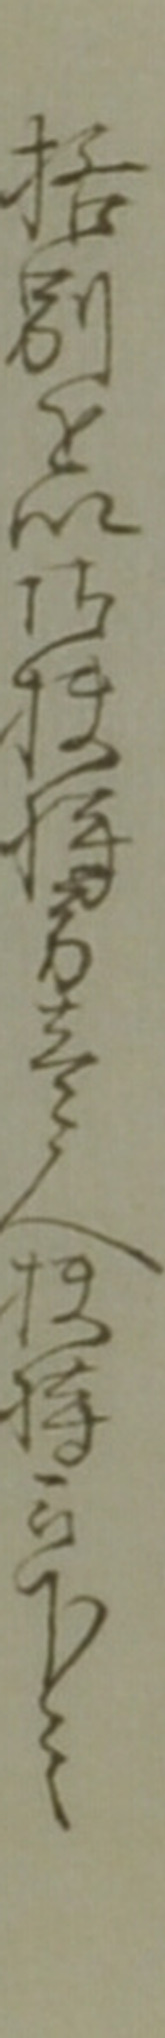格別を以御扶持方壱人扶持被下之
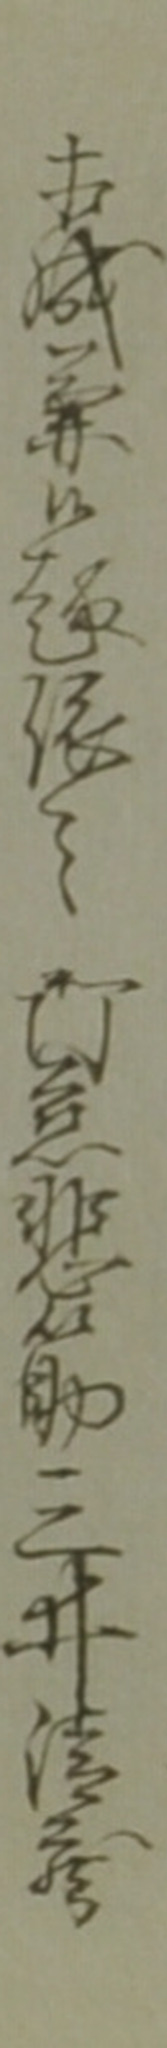相成兼候趣依之御慈悲筋三井清蔵
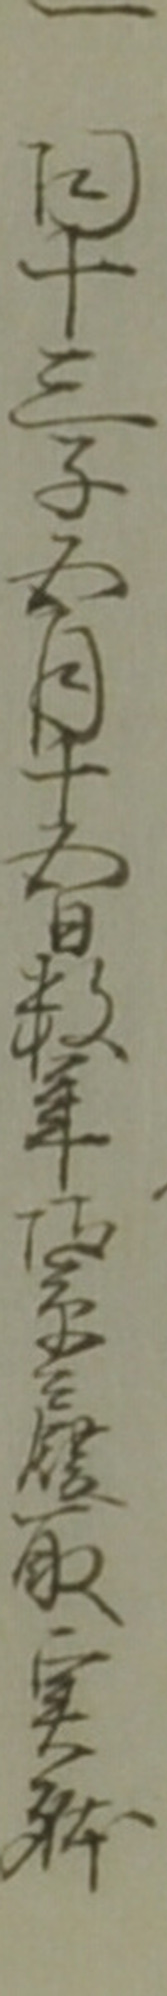一同十三子五月十五日数年御草履取実体
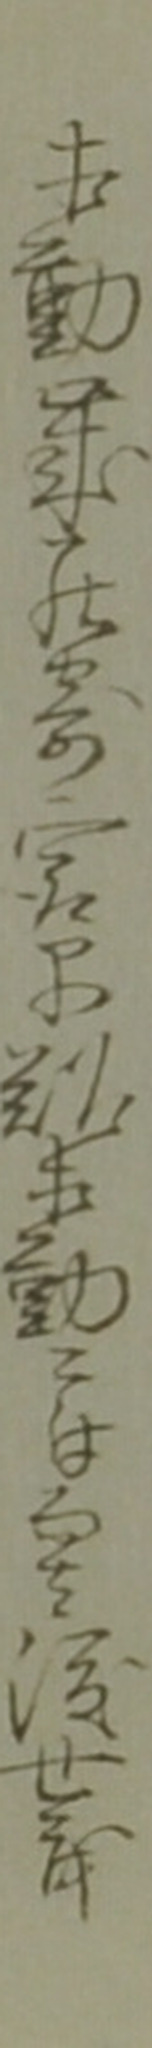相勤歳罷寄最早難相勤ニ付而は後世茂
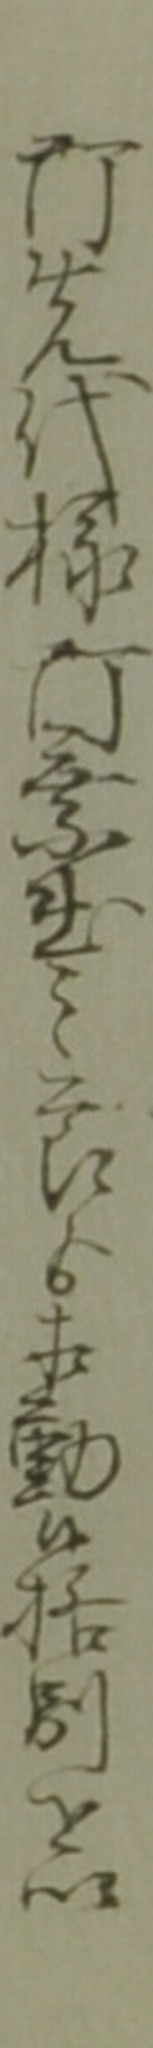御先代様御乗出之節ゟ相勤候格別を以
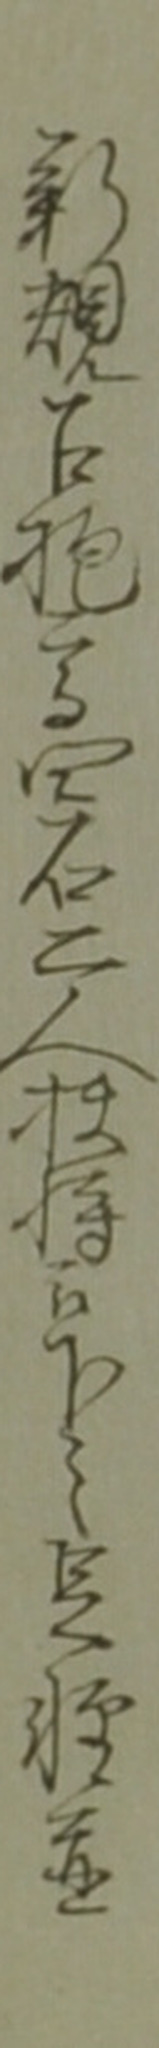新規召抱高四石二人扶持被下之足軽並
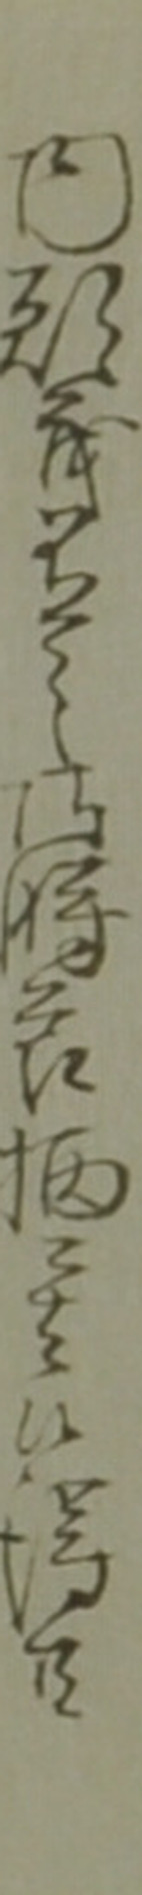内願茂有之御時節ニは候得共
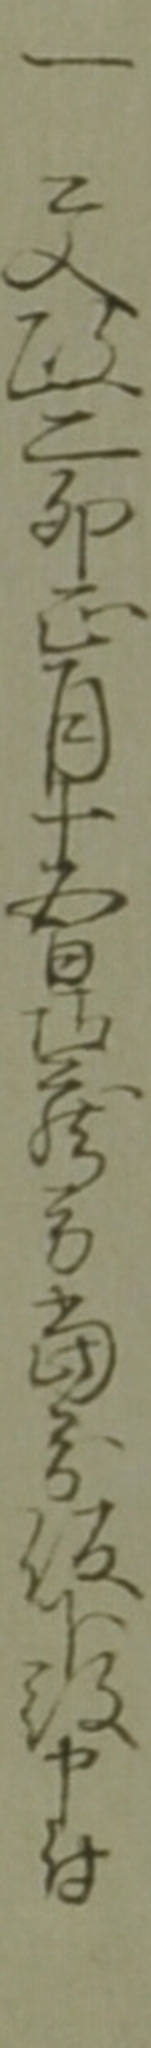一文政二卯正月十五日御蔵方当分仮下役申付
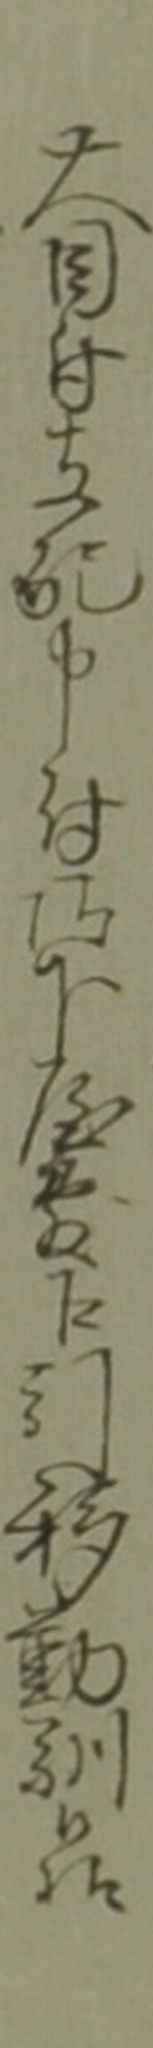大目付支配申付御下屋敷江引移馴候様
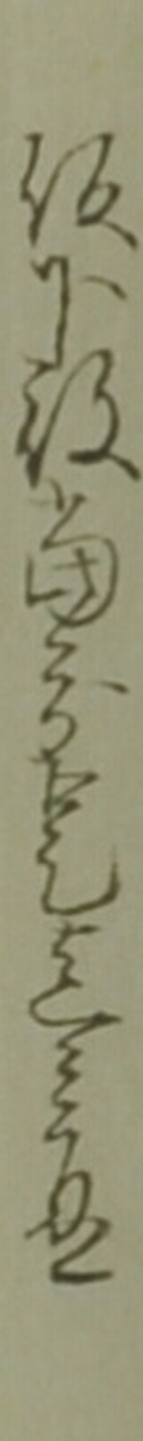仮下役当分是迄之通
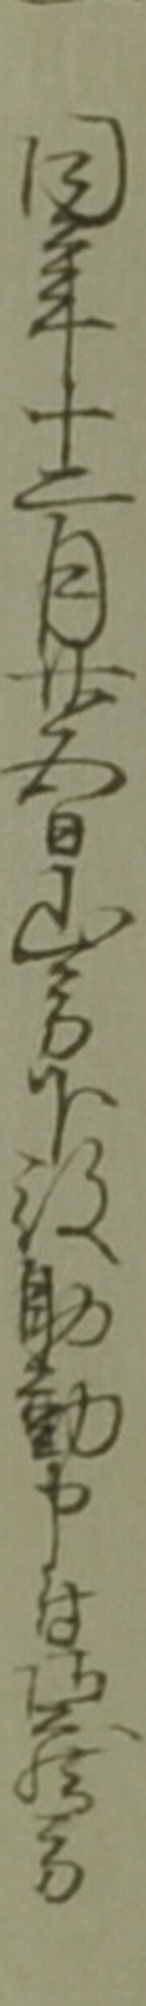一同年十二月廿五日山方下役助勤申付御蔵方
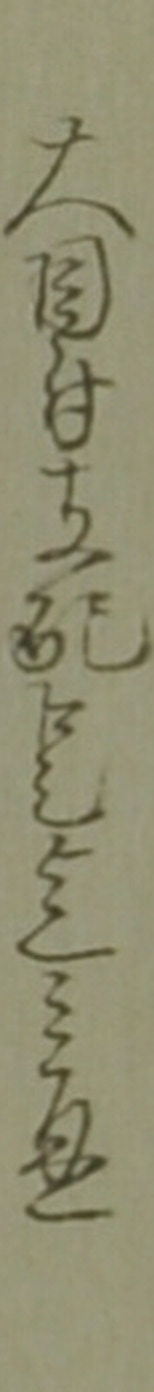大目付支配是迄之通

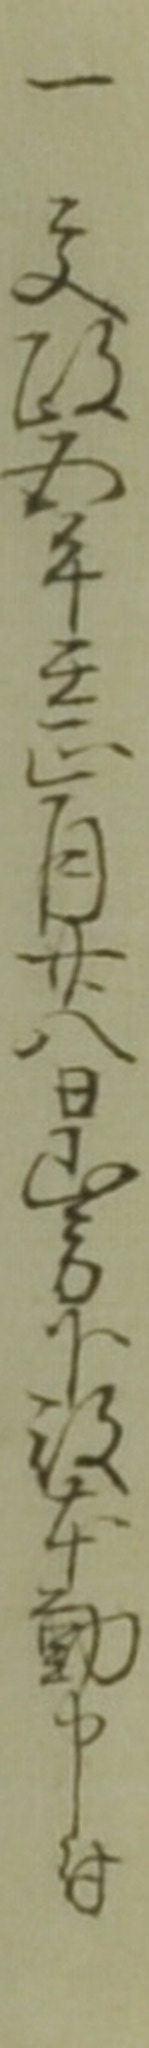一文政五午閏正月廿八日山方下役本勤申付
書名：無足諸士勤仕録（八）
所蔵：伊那市立高遠町図書館・合同会社AMANE
